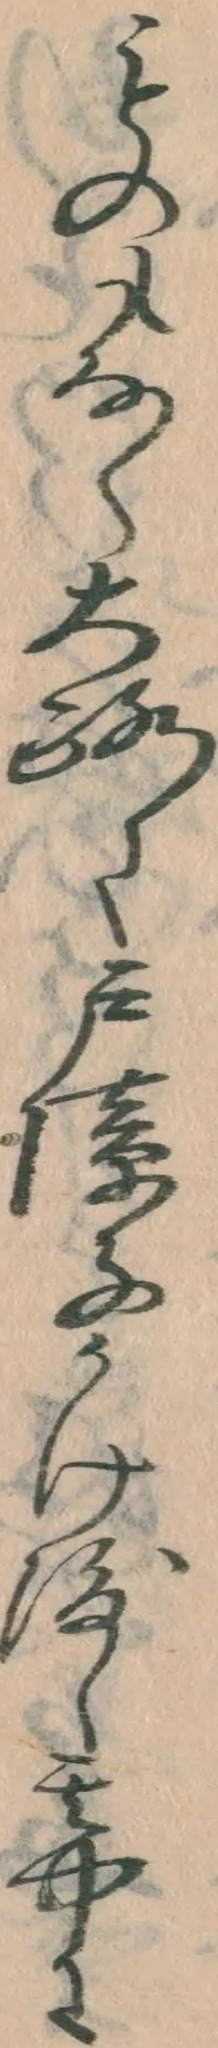ものもなく大路に戸障子かけ渡し其中に
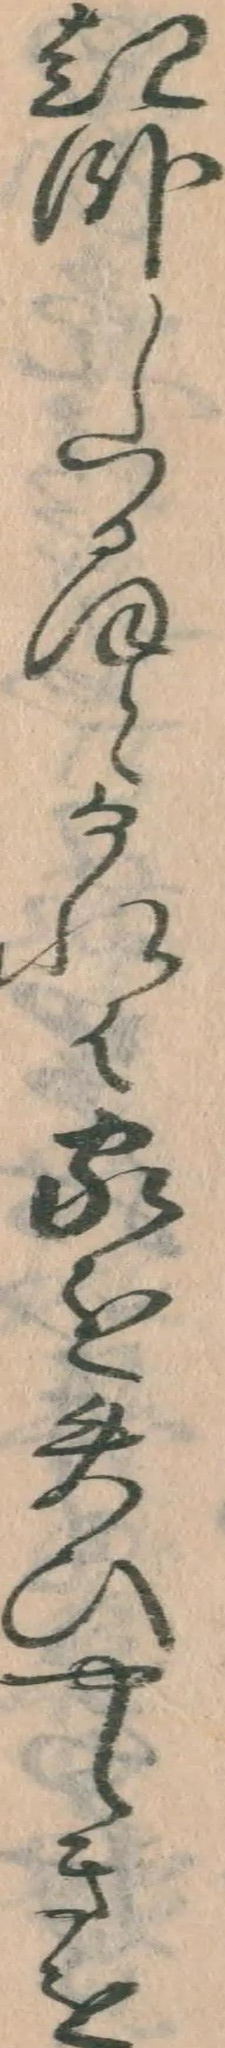起臥しつるほとなれは家を失ひやしきを
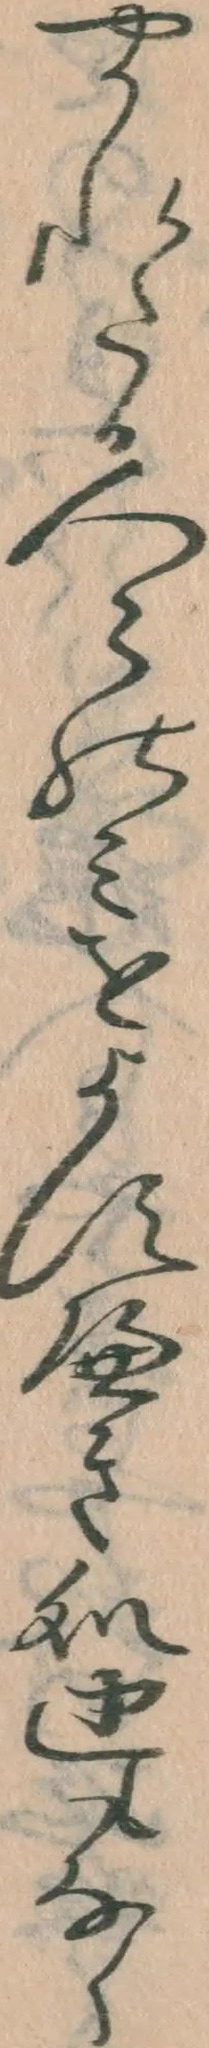やかれたる人々のミをよすへき処迚もなく
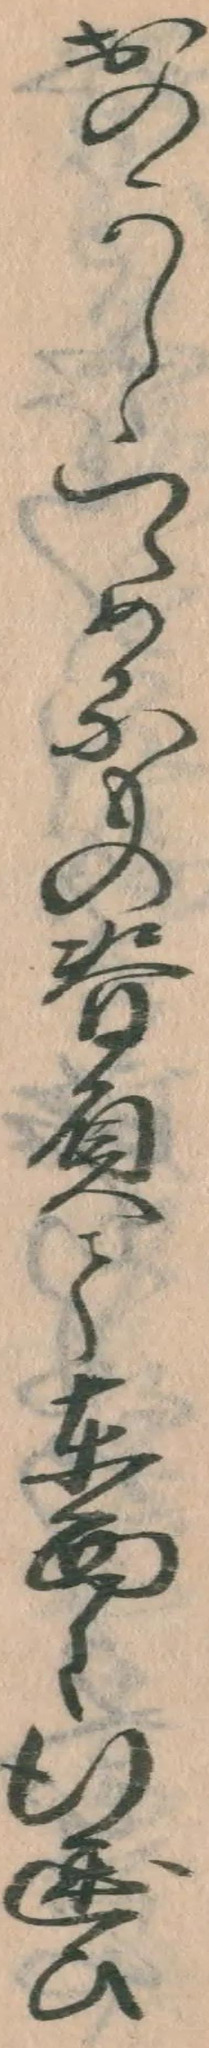おのかしゝつゝめるもの背負て東西に行迷ひ
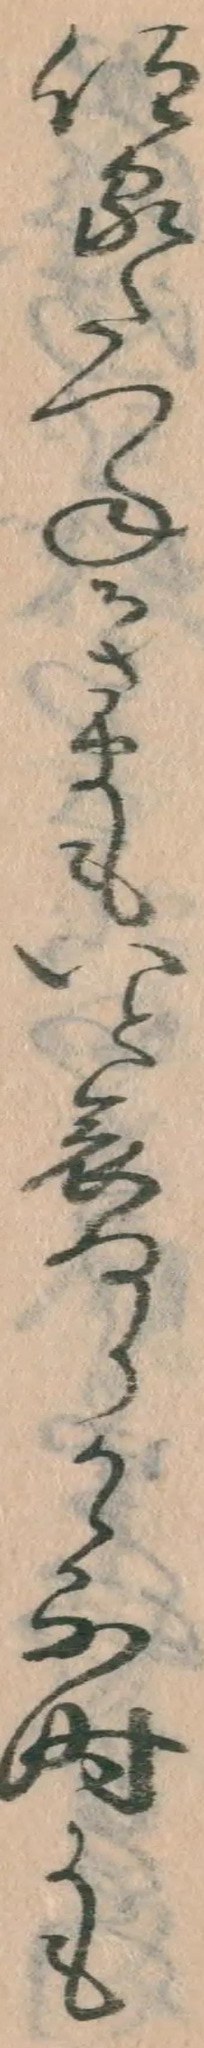住家たつねるさまもいと哀なりかゝる時にも
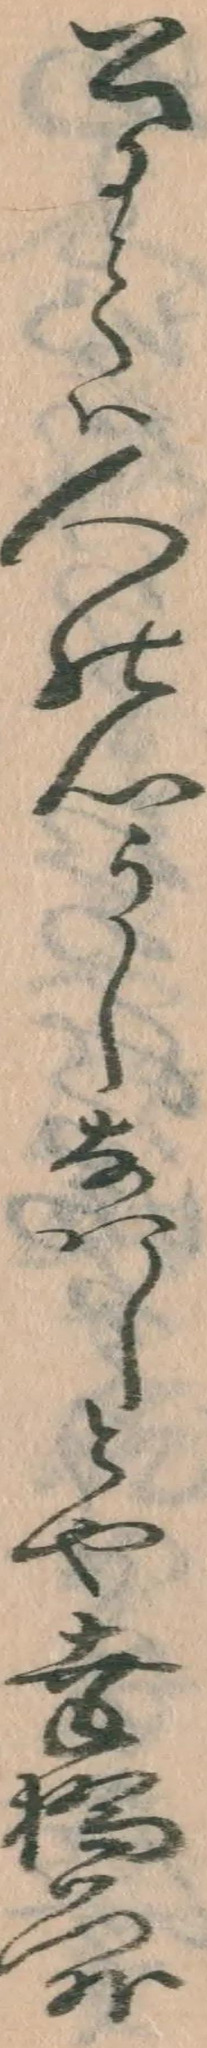公にてハ人の心うしなハしとや幸橋御門外
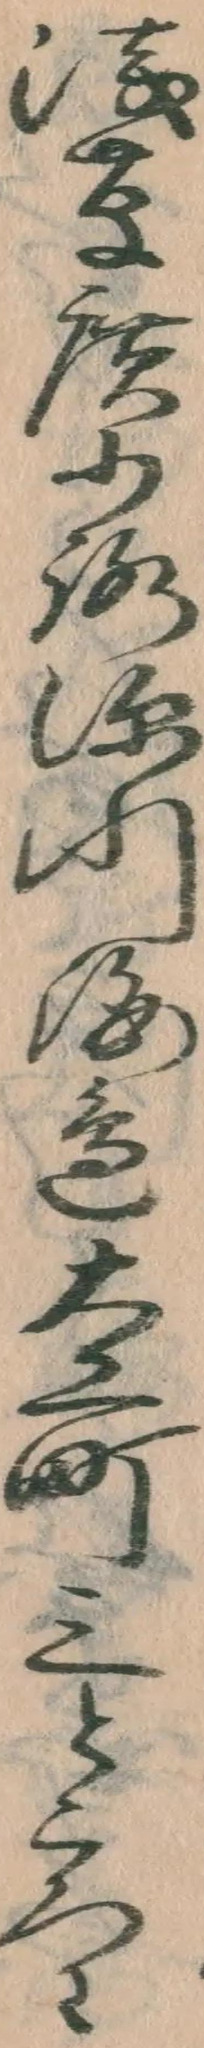浅草廣小路深川海邊大工町三ところに
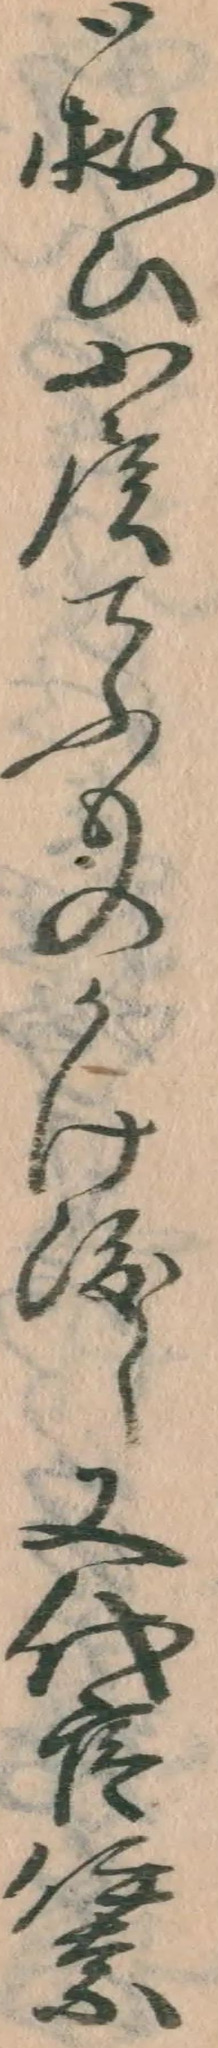御救ひ小屋てふものかけ渡し又代官伊奈
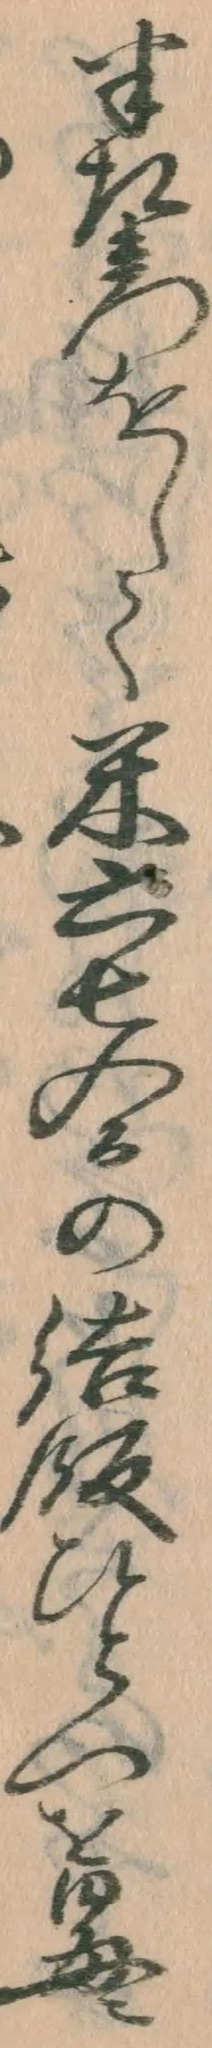半左衛門をして米六七合の詰飯ひとつを日毎ニ
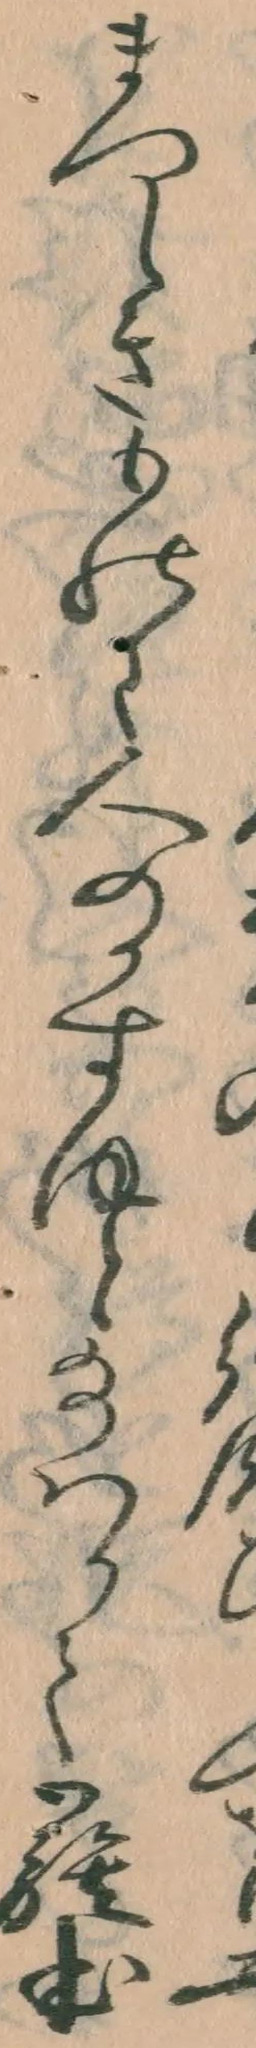まつしきものに人のかすほと玉ハりて御旗本
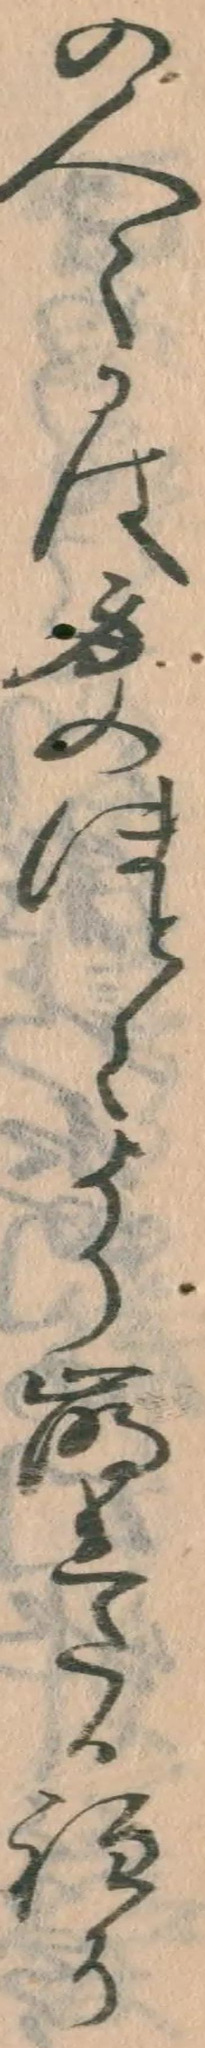の人々には身のほとにより崩れたる程に
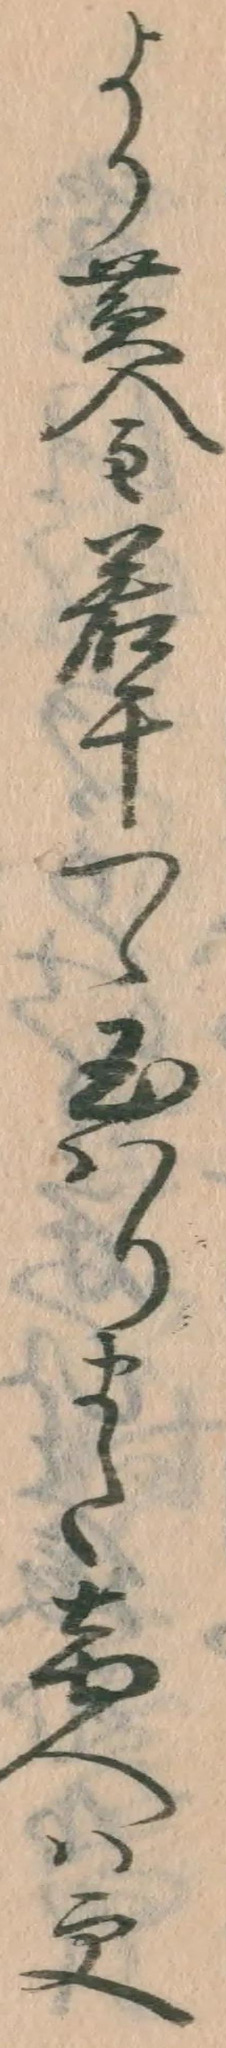より黄金若干つゝ玉ハりまた商人ハ更
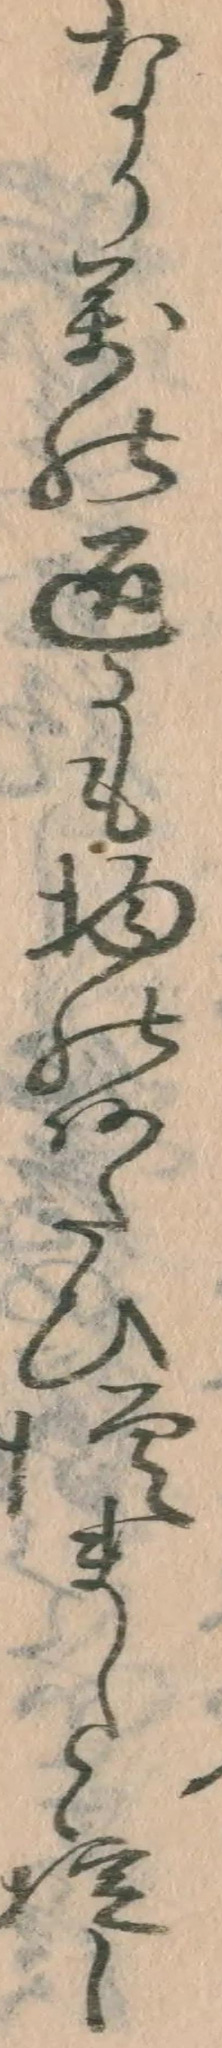なり萬の匠にも物のあたひ増まして掟し
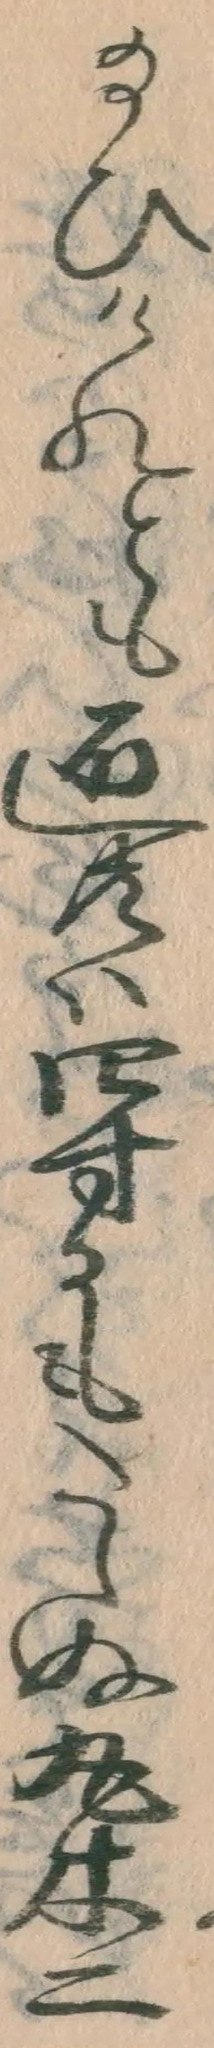玉ひけれとも匠共ハ四寸にもたらぬ丸木二
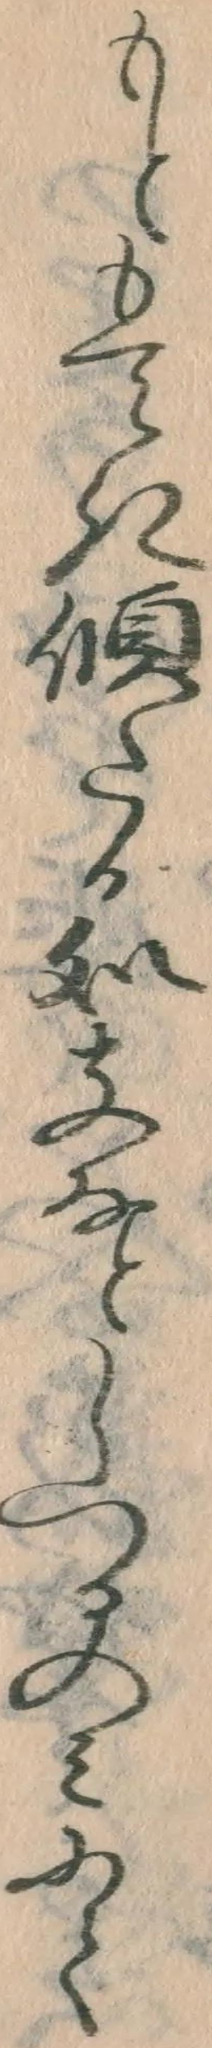もともてき傾たる処支えなとしつるのミにて
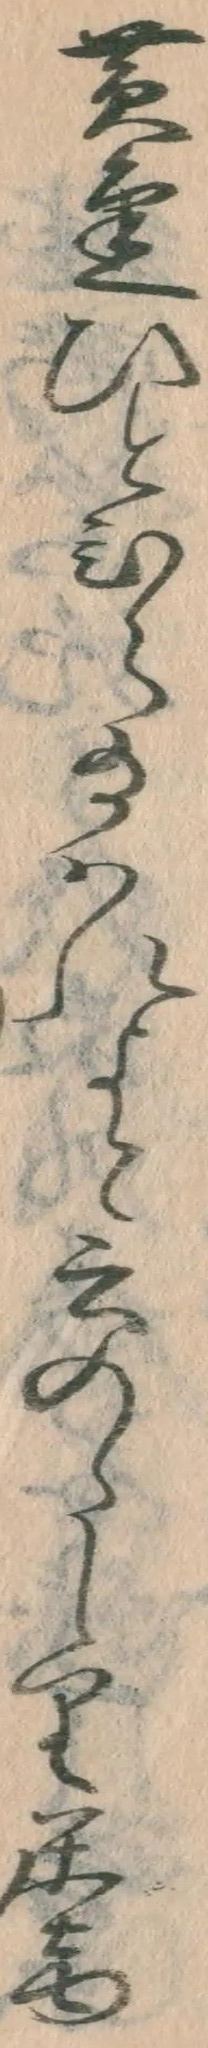黄金ひとひら玉ハれよと云のゝしり米商
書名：麗斎叢書. 20
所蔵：国立国会図書館 National Diet Library, JAPAN
